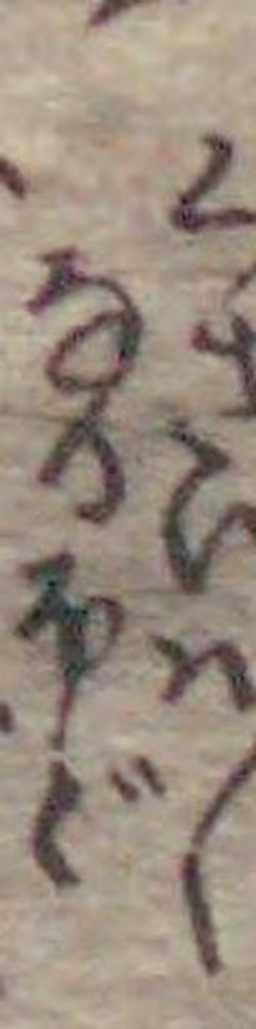なるほど
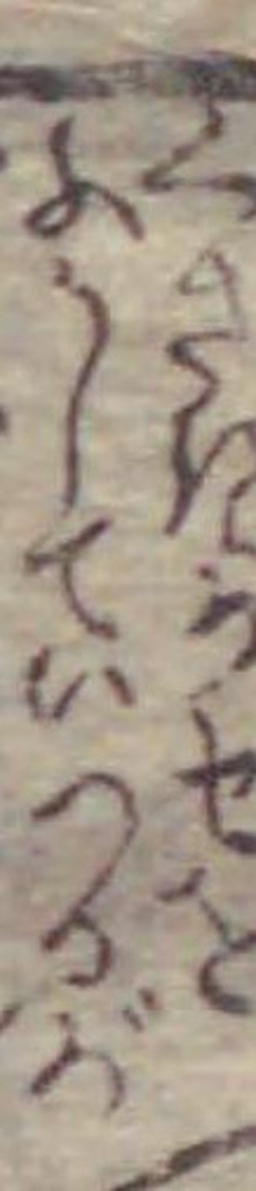ふかしていつるが
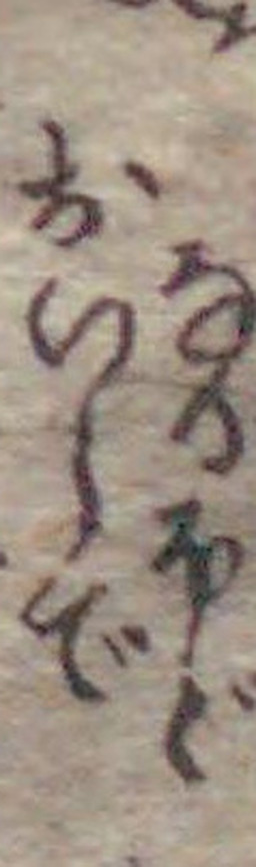おいらで
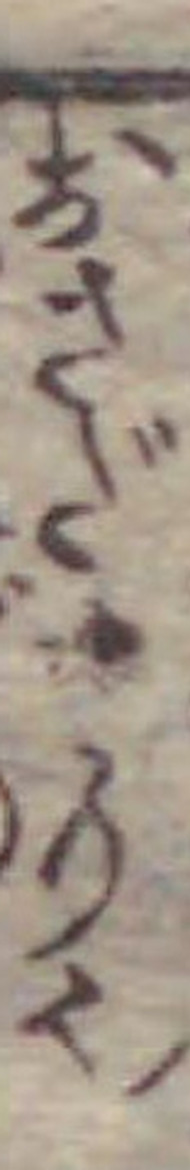おさだまり也
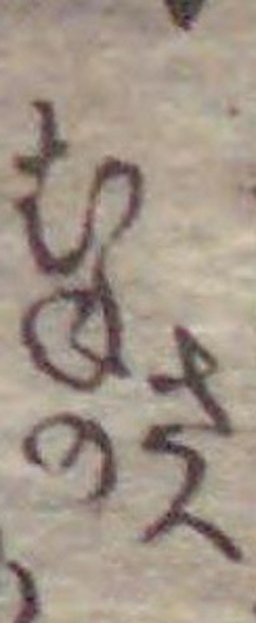むねの
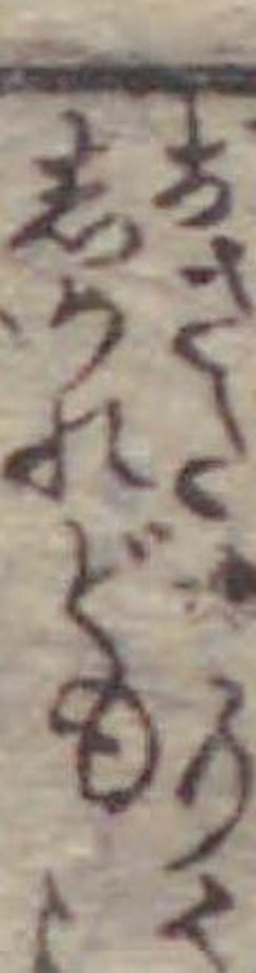しかれども
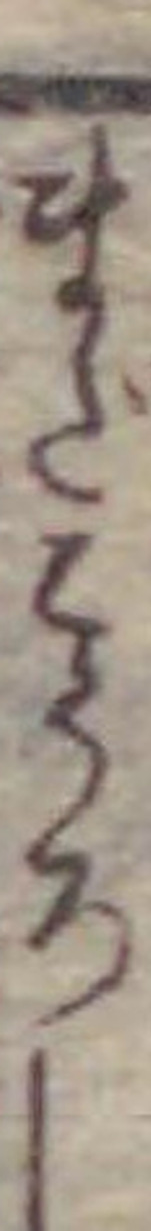まだこゝろ
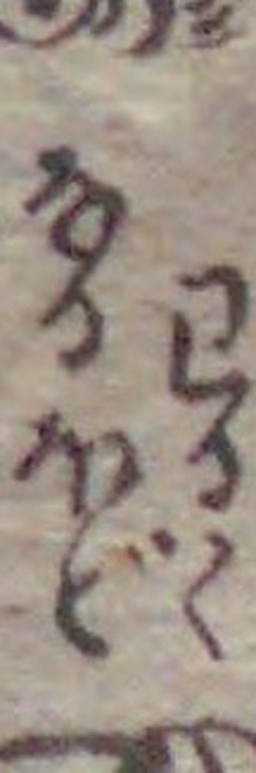なるほど
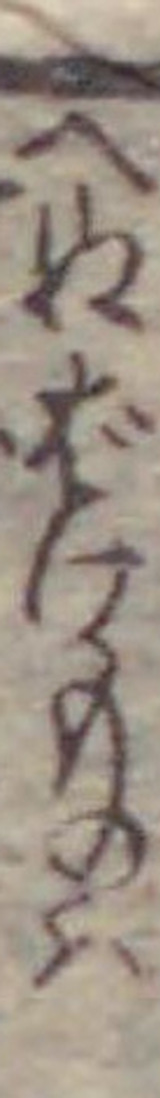へぬばけものは
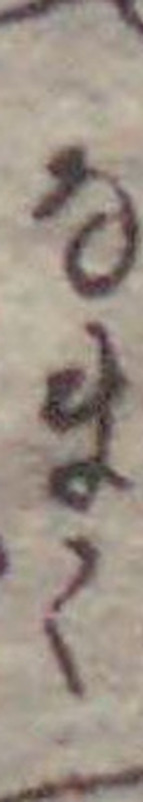なまく
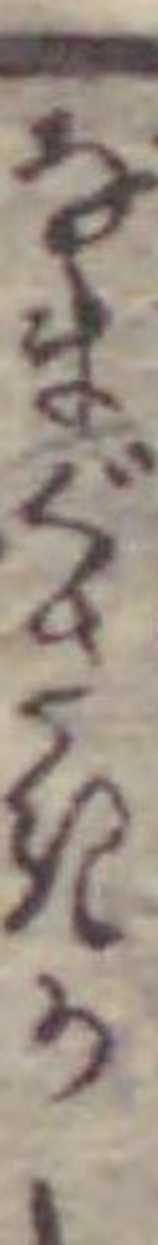なまぐさきか
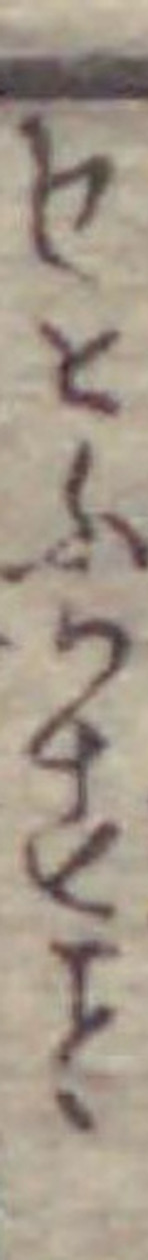せとふかすこと
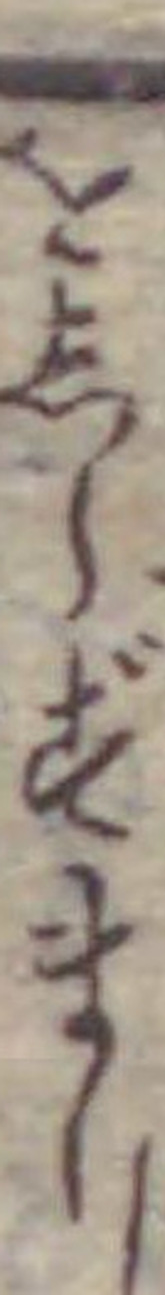をしらずまし
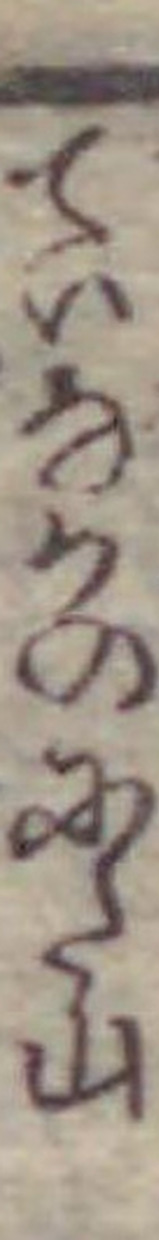ていなかのにた山
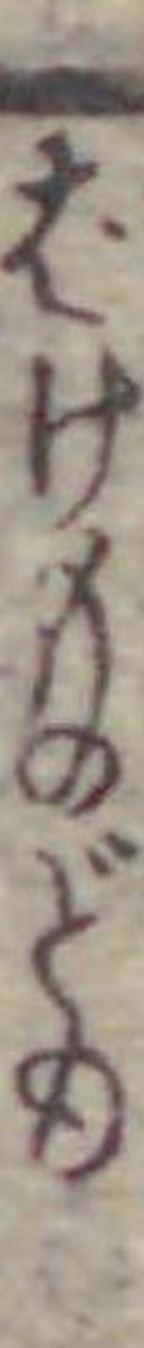ばけものども
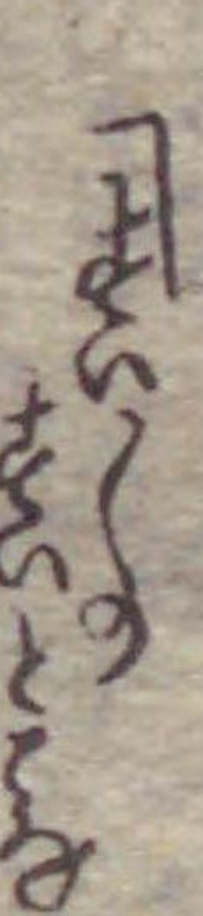〽すい〳〵の
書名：化物見世開 : 2巻
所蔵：国立国会図書館 National Diet Library, JAPAN
